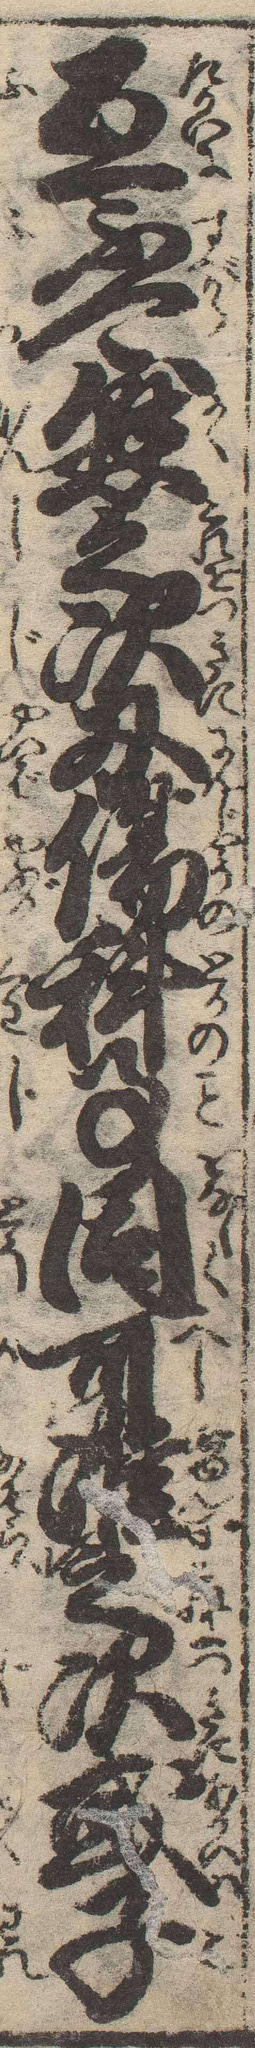互不可懸之次刃傷科事同可准之次或子
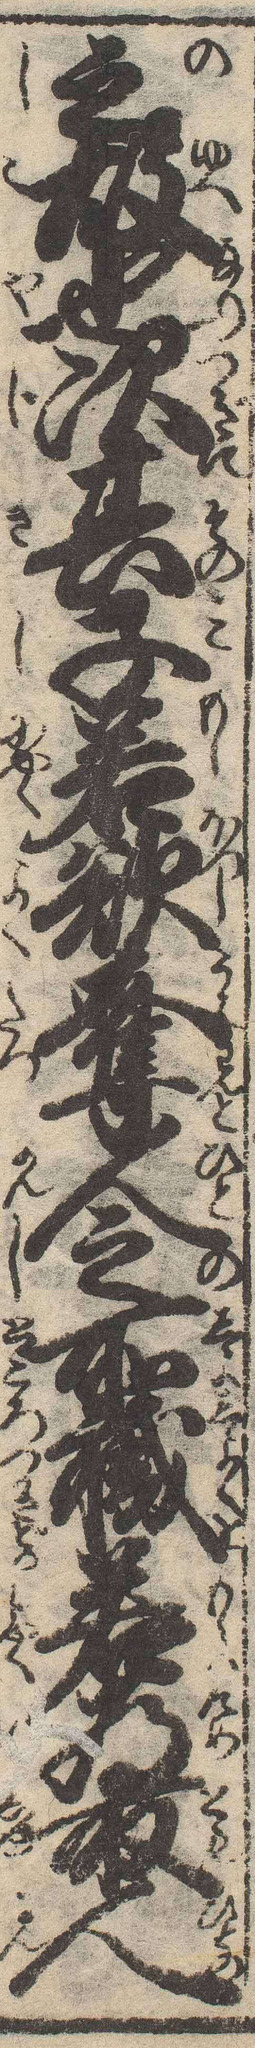之故也次其子若欲奪人之所職若為取人
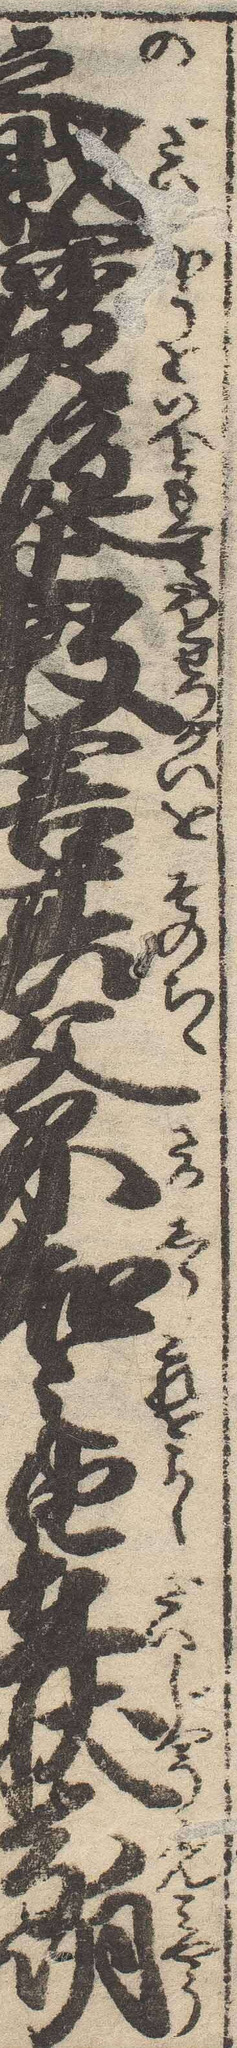之財寶雖企殺害其父不知之由在状分明
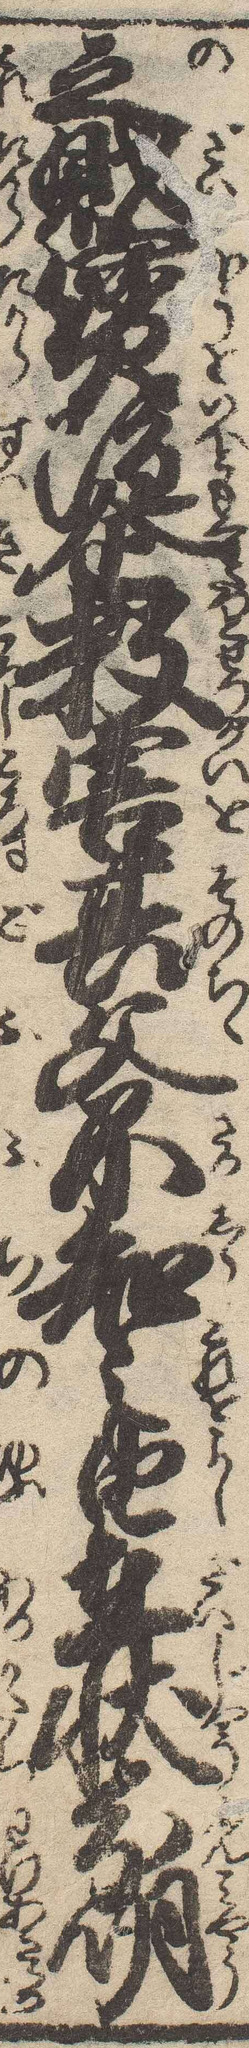之財寶雖企殺害其父不知之由在状分明
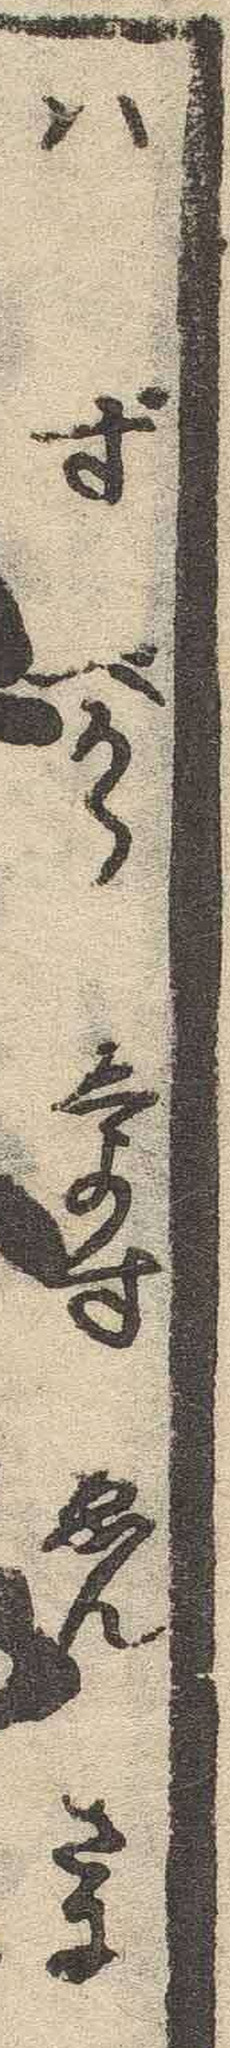はずべからしよすゑんさに
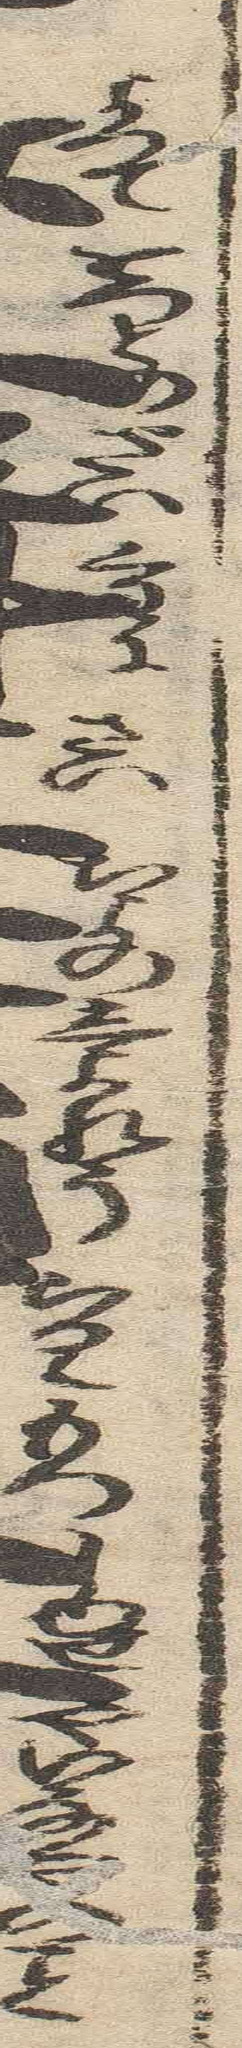よつてをつとのざいくわにさいちよのしよれうらるゝもつしゆせやいなやのこと
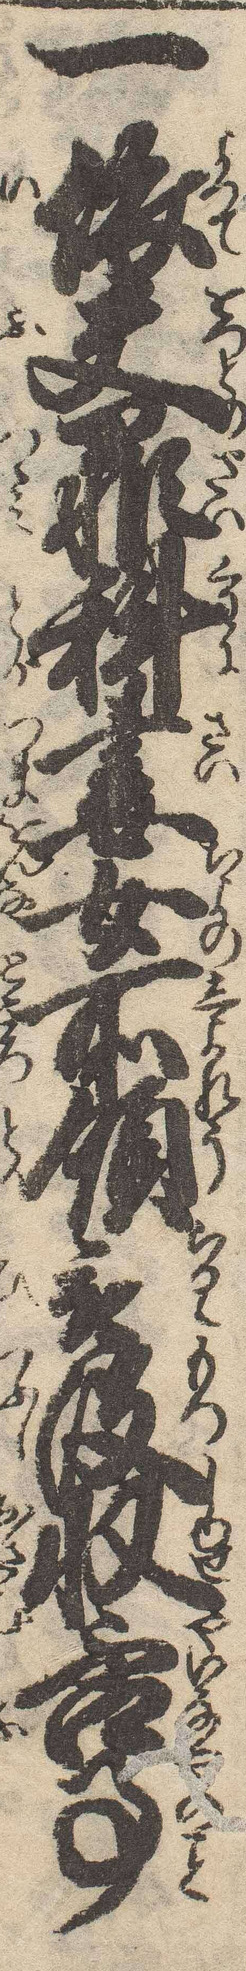一依夫罪科妻女所領被没収否事
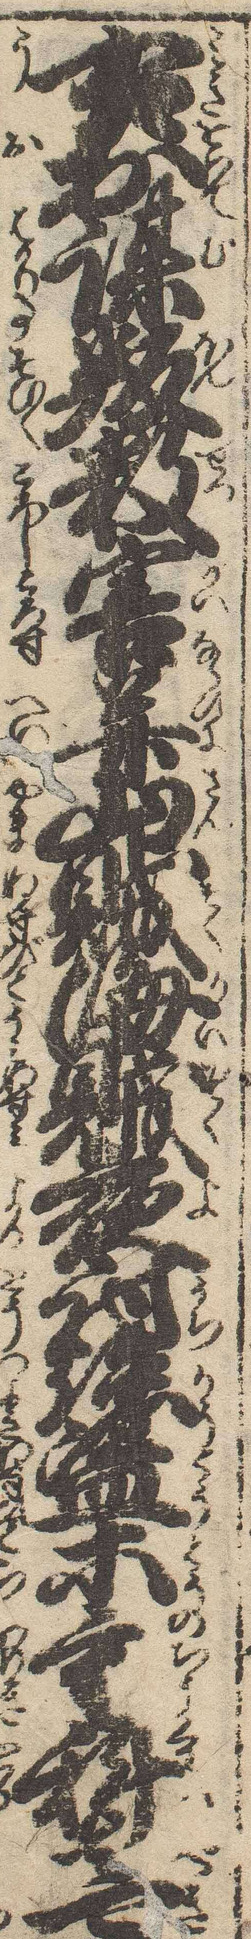右於謀叛殺害幷山賊海賊夜討強盗等重科者可
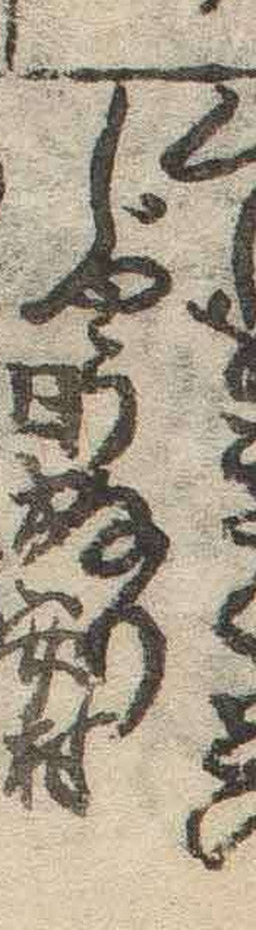じやうなり
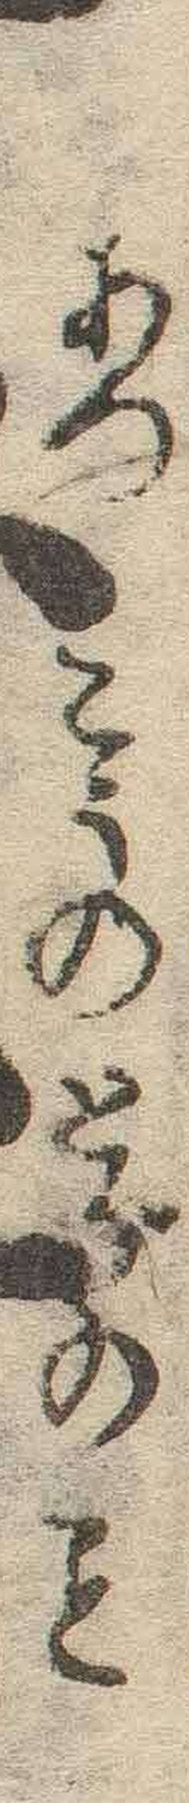あつこうのとがのこと
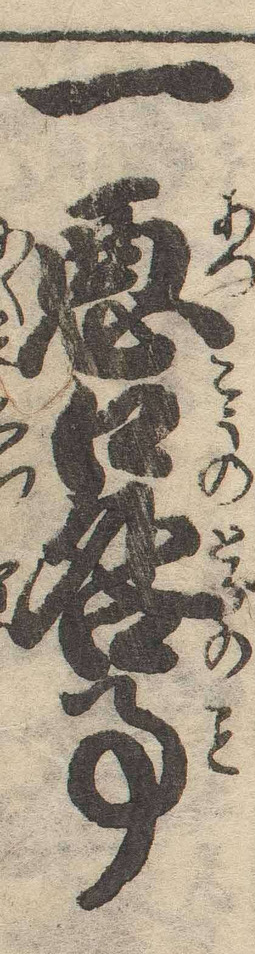一悪口咎事
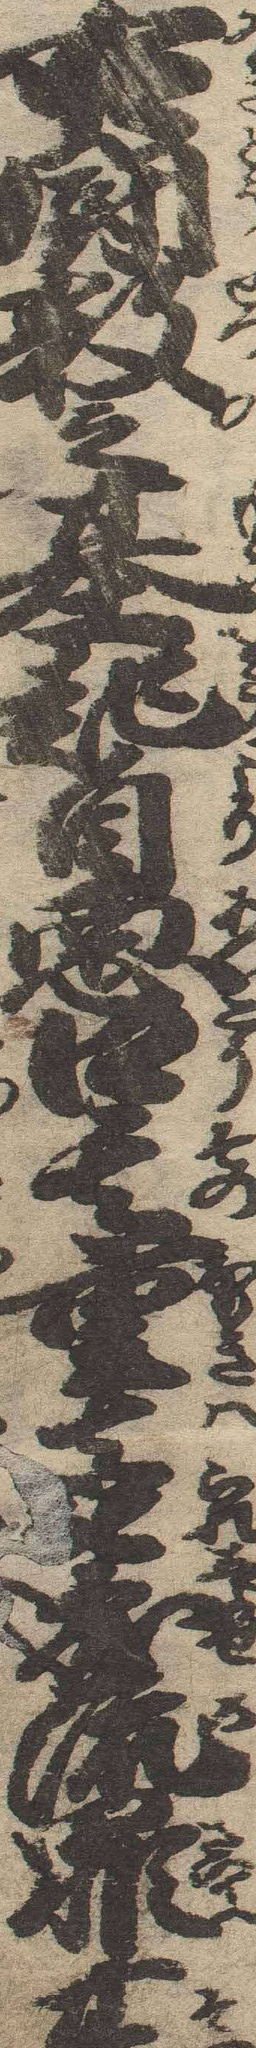右闘殺之基起自悪口其重者被處流罪其

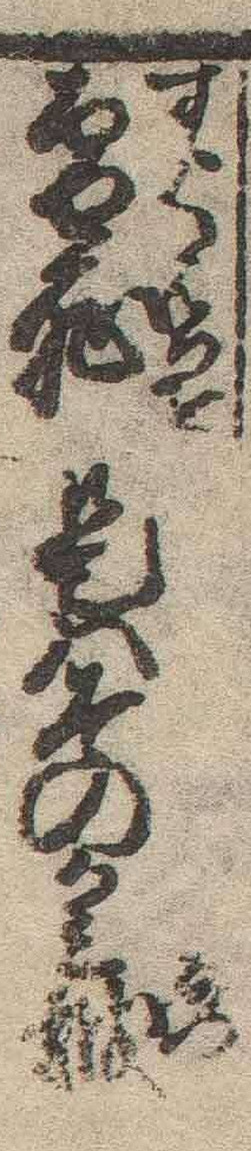雪恥是はそのかみ越
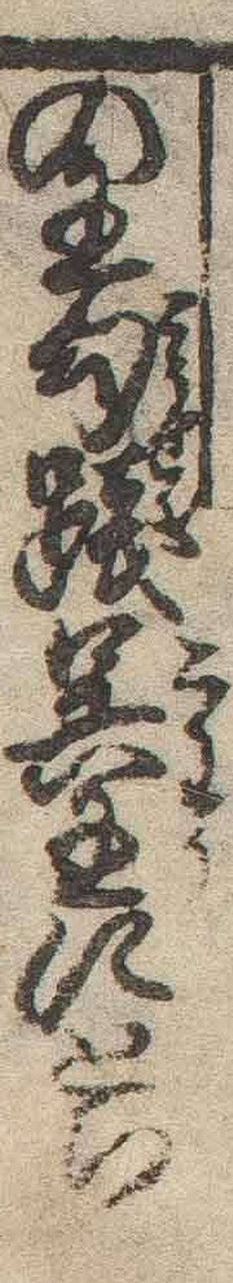の王勾践呉王にとら
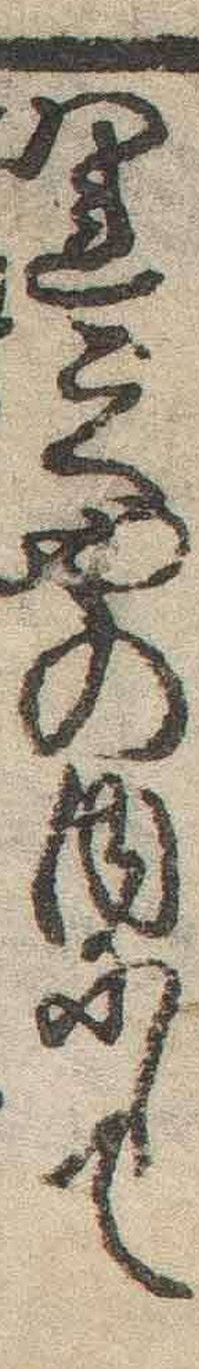はれこくやの内にて
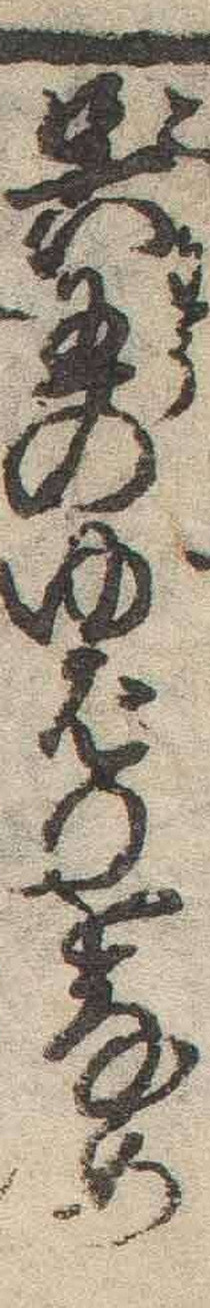呉王のゆばりをなめ
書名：御成敗式目絵抄
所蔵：東京学芸大学附属図書館 国文学研究資料館
